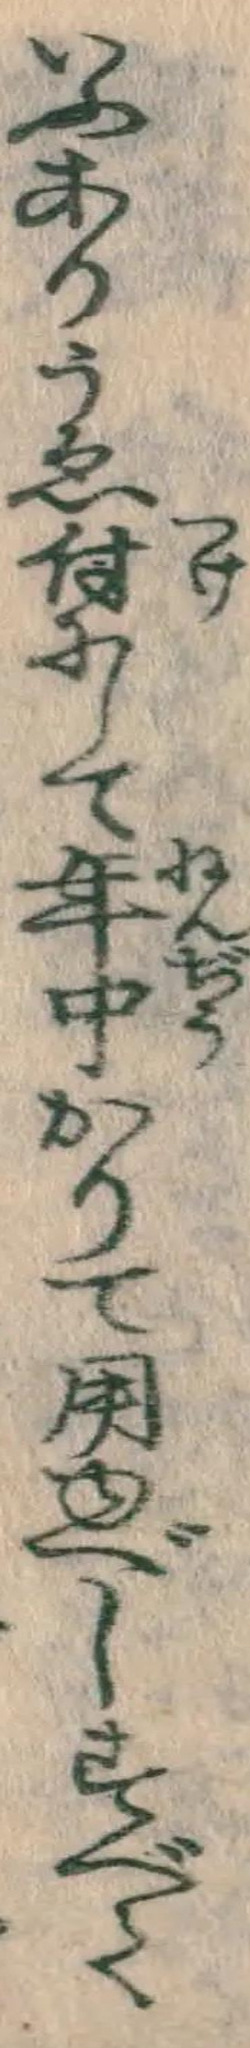いふありうゑ付にして年中かりて用ゆべしすべて
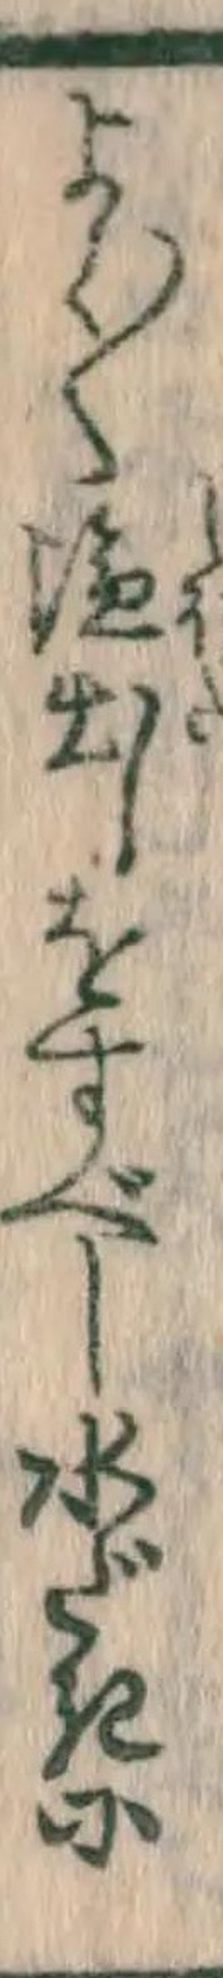よく〳〵塩出しをすべし水だきに
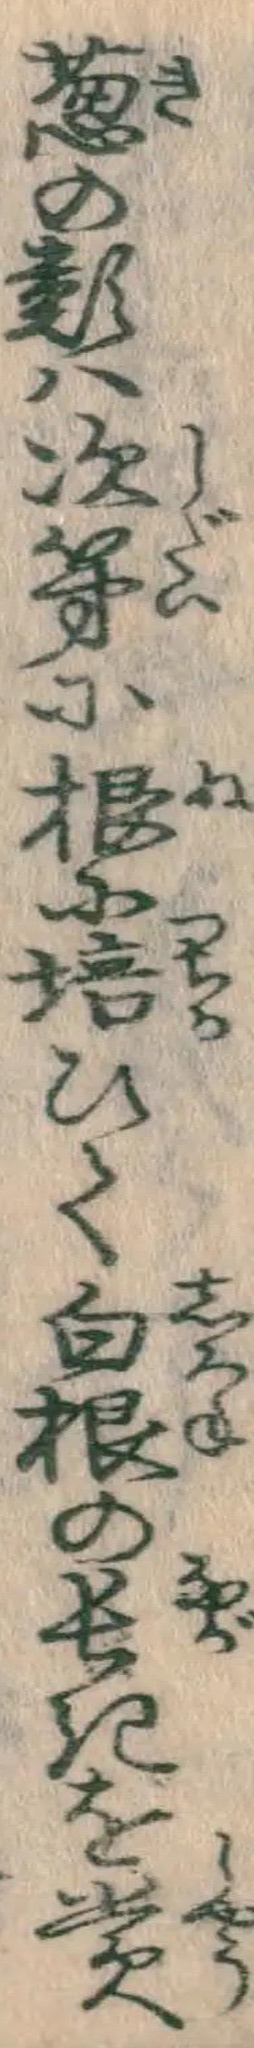葱の類は次第に根に培ひて白根の長きを賞
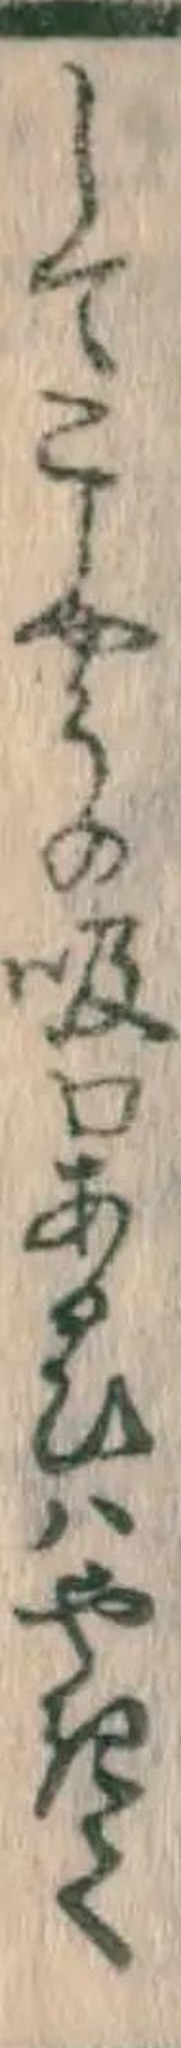してこしやうの吸口あるひはやきて
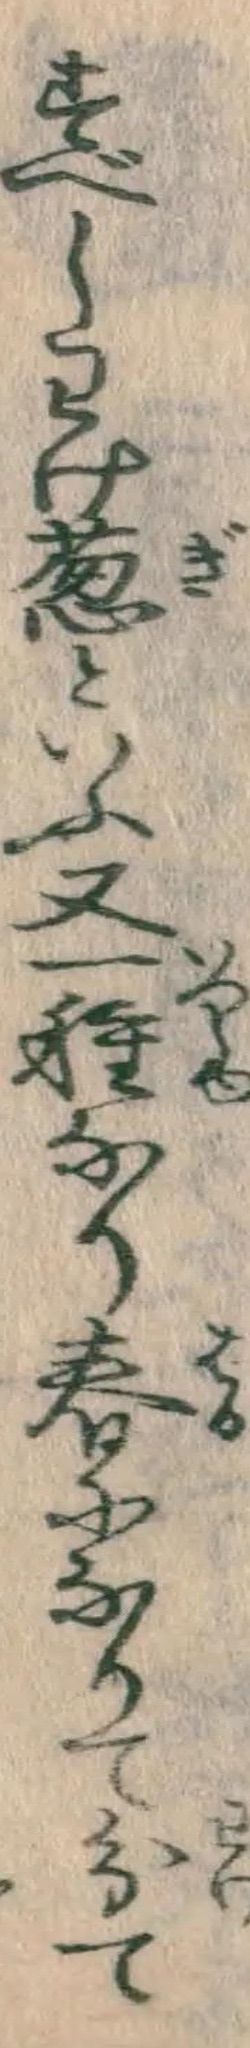すべしわけ葱といふ又一種なり春になりて分て
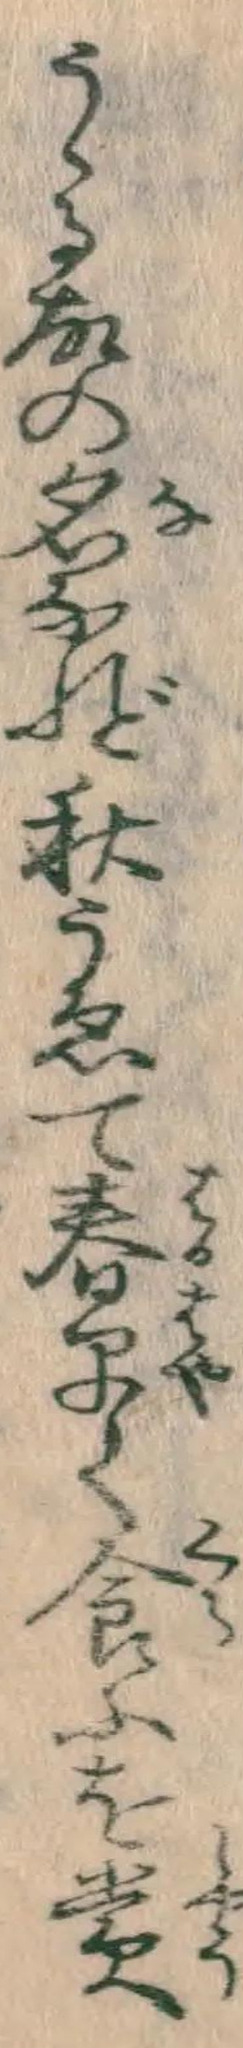うゝる故の名なれど秋うゑて春早く食ふを賞
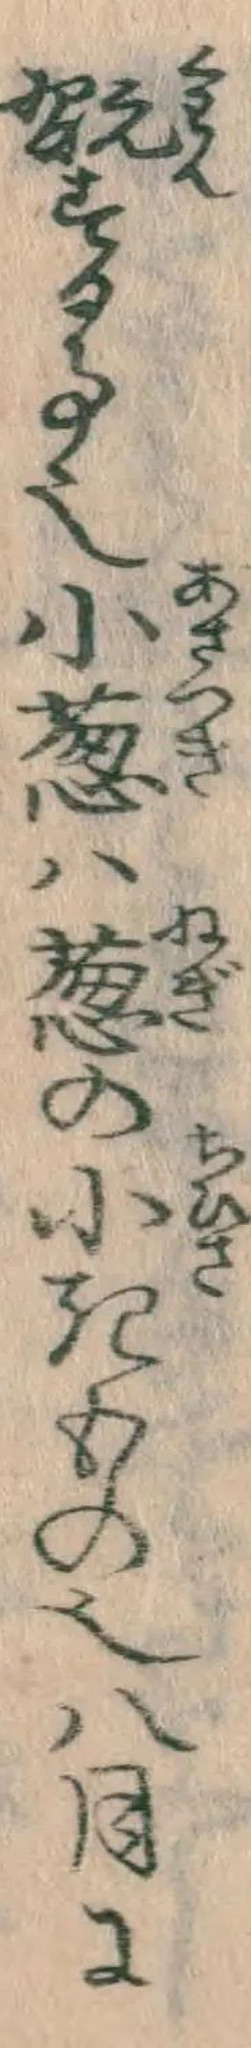翫する事也小葱は葱の小きもの也八月に
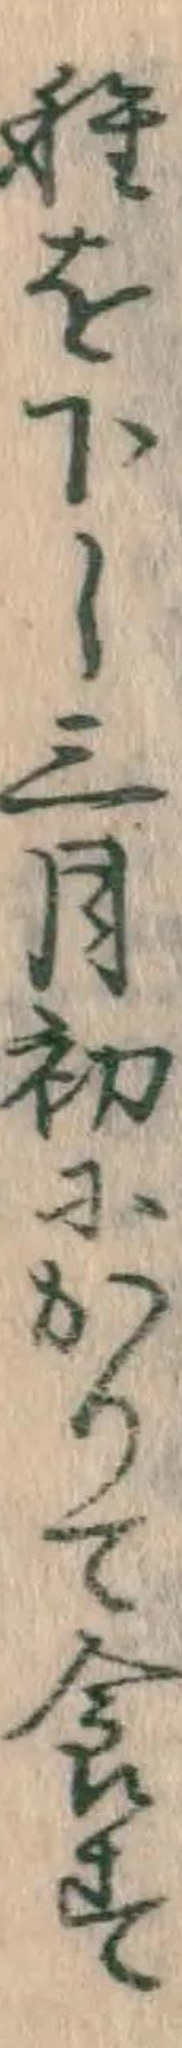種を下し三月初にかりて食す
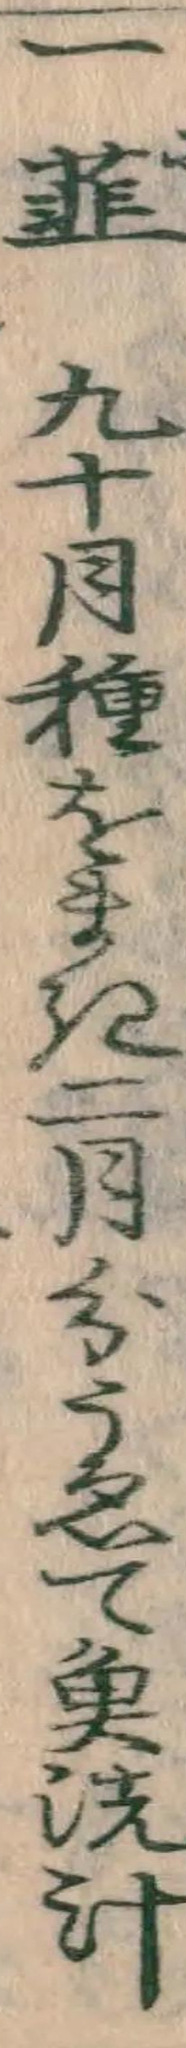一韮九十月種をまき二月分うゑて魚洗汁
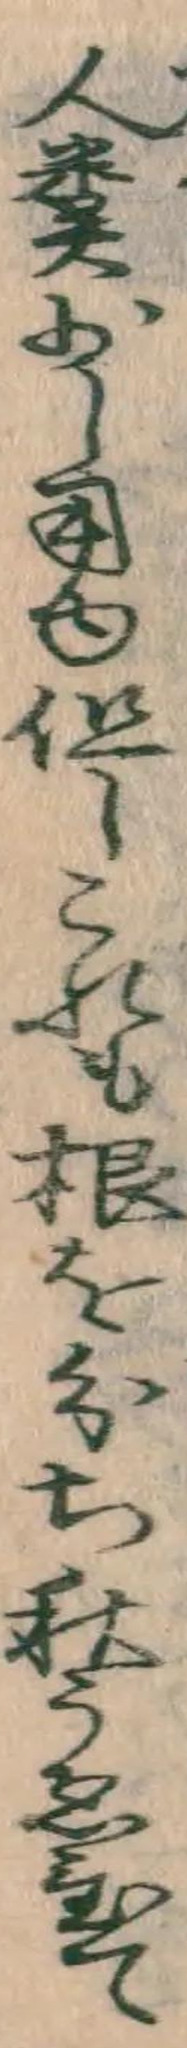人糞少し用ゆ但しこれも根を分ち秋うゑ置て
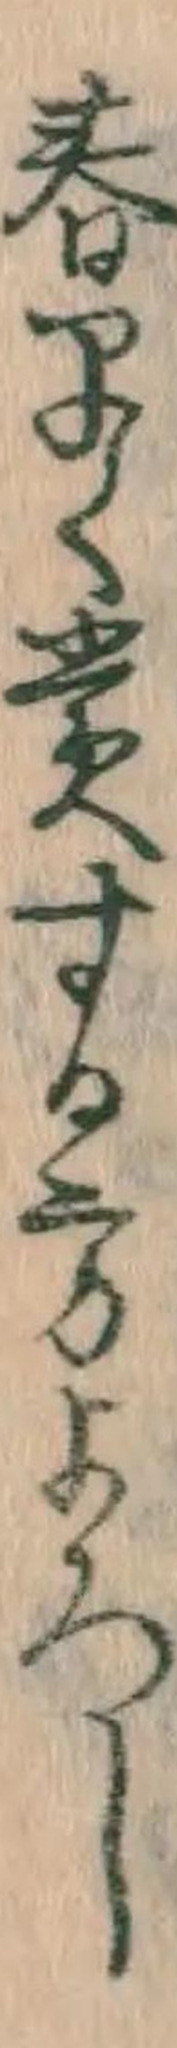春早く賞する方よろし
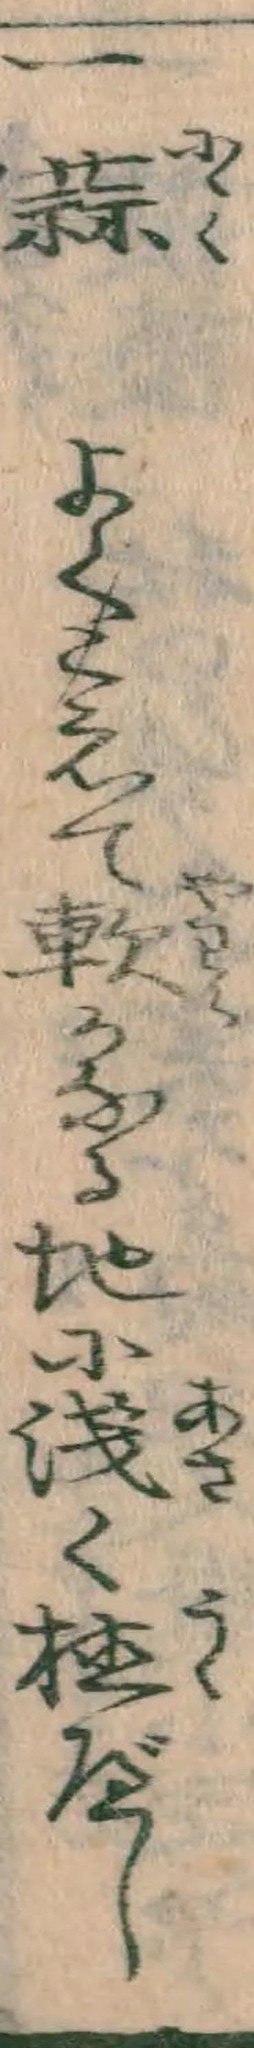一蒜よくこえて軟かなる地に浅く植べし
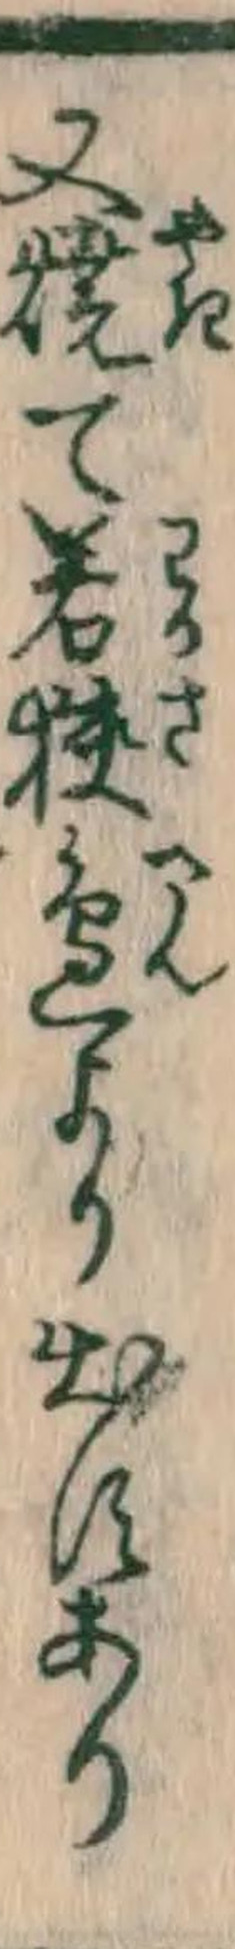又焼て若狭辺より出すあり
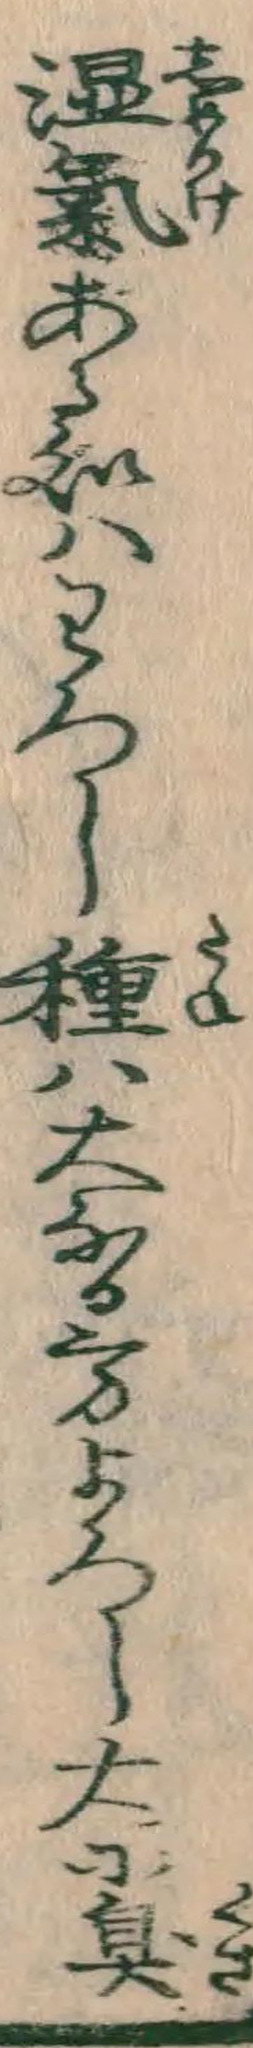湿気ある処はわろし種は大なる方よろし大に臭
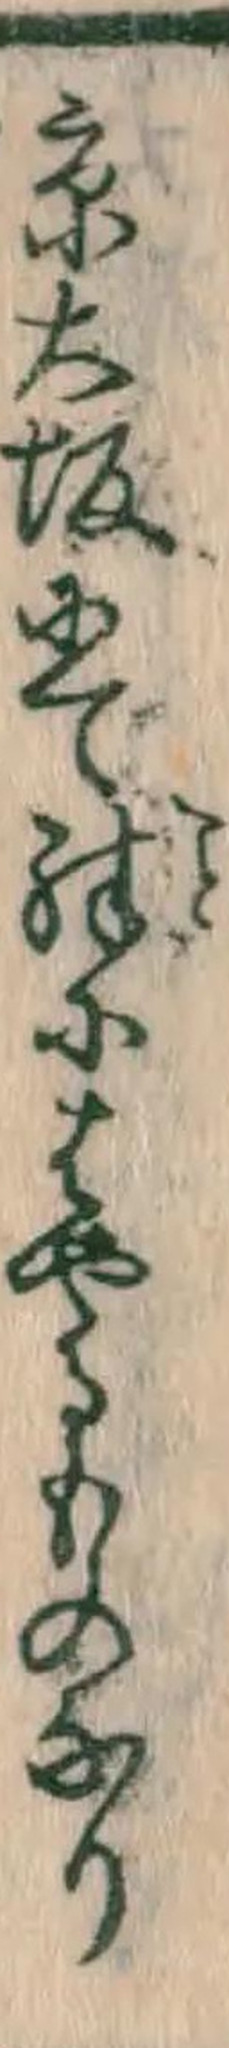京大坂にて殊にはやるものなり
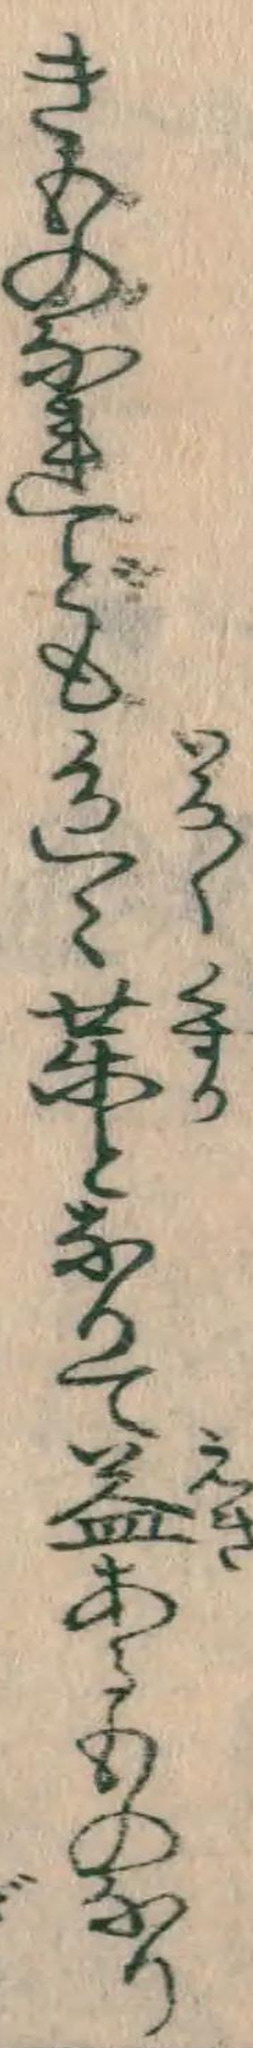きものなれども色々薬となりて益あるものなり
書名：広益秘事大全 3巻. [5]
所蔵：国立国会図書館 National Diet Library, JAPAN
